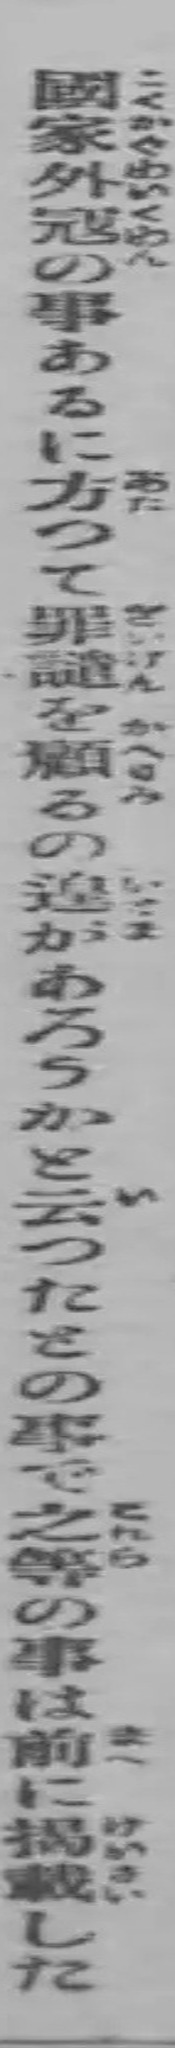国家外寇の事あるに方つて罪譴を顧るの遑があろうかと云つたとの事で之等の事は前に掲載した
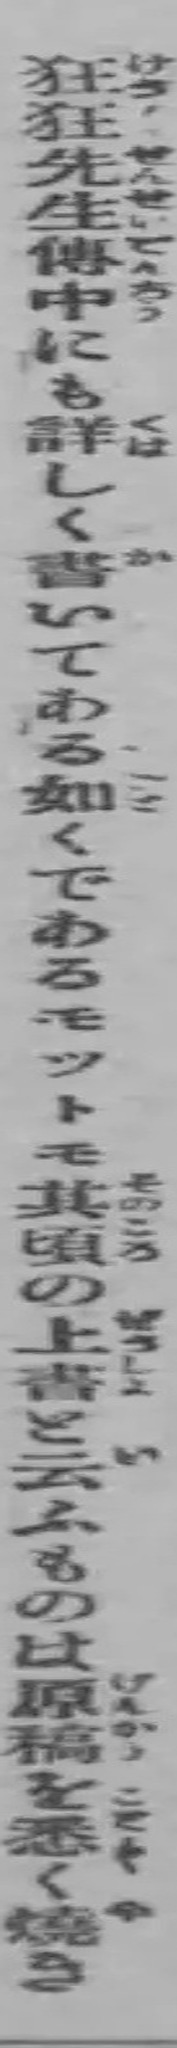狂狂先生伝中にも詳しく書いてある如くであるモツトモ其頃の上書と云ふものは原稿を悉く焼き
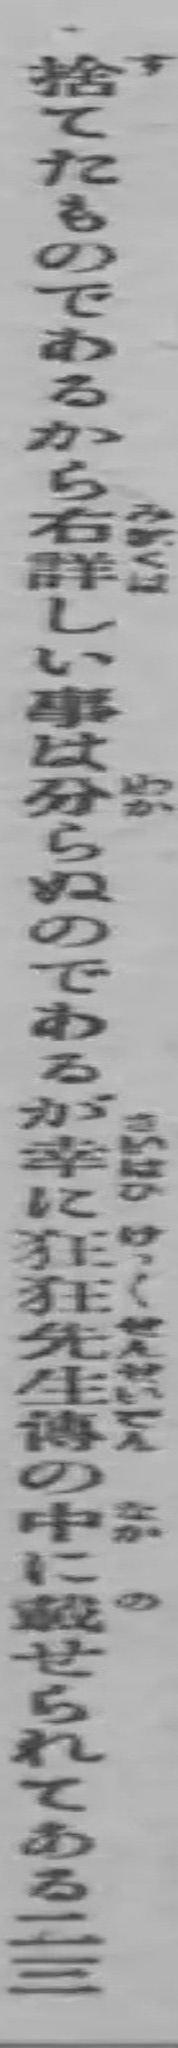捨てたものであるから右詳しい事は分らぬのであるが幸に狂狂先生伝の中に載せられてある二三
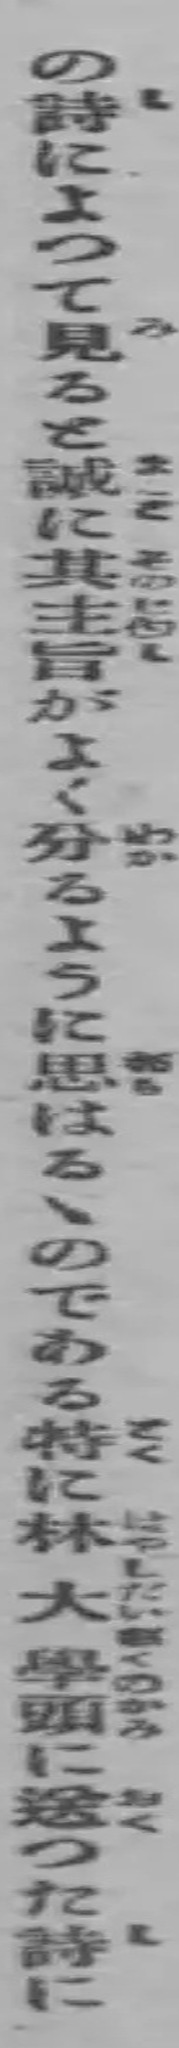の詩によつて見ると誠に其主旨がよく分るように思はるゝのである特に林大学頭に送つた詩に
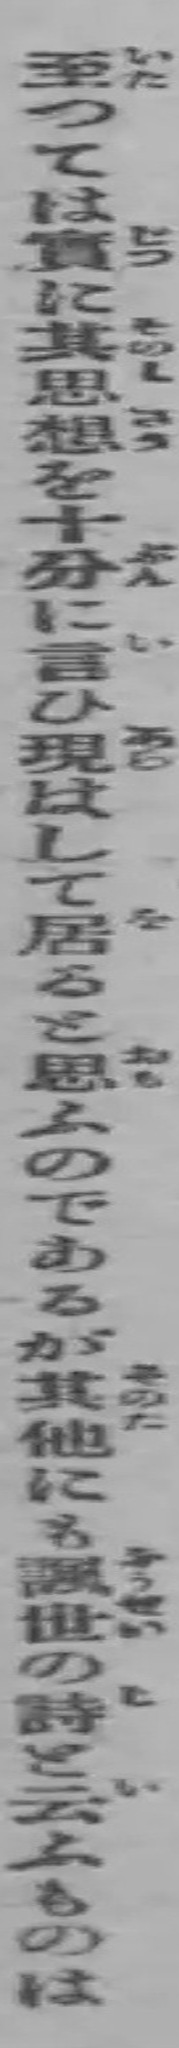至つては実に其思想を十分に言ひ現はして居ると思ふのであるが其他にも諷世の詩と云ふものは

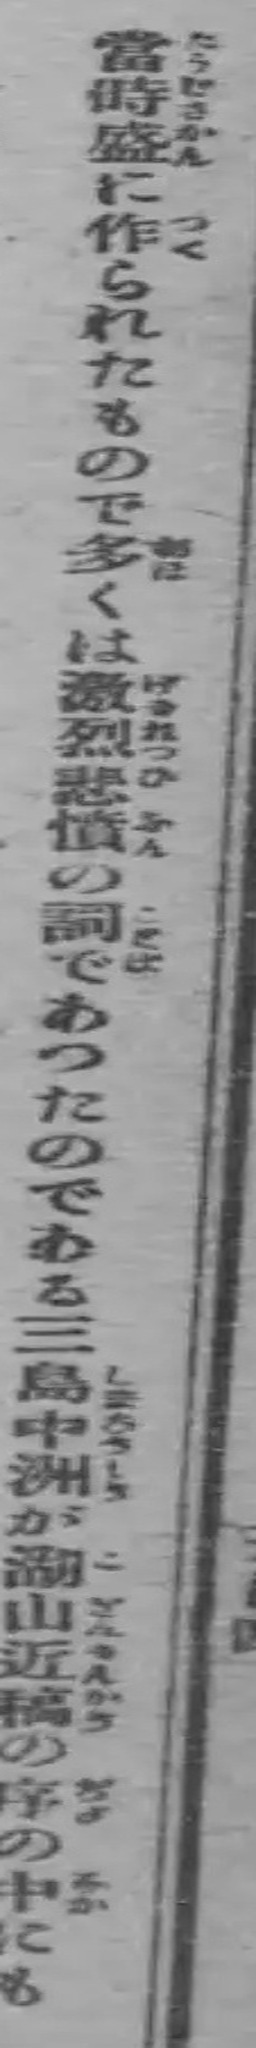当時盛に作られたもので多くは激烈悲憤の詞であつたのである三島中洲が湖山近稿の序の中にも
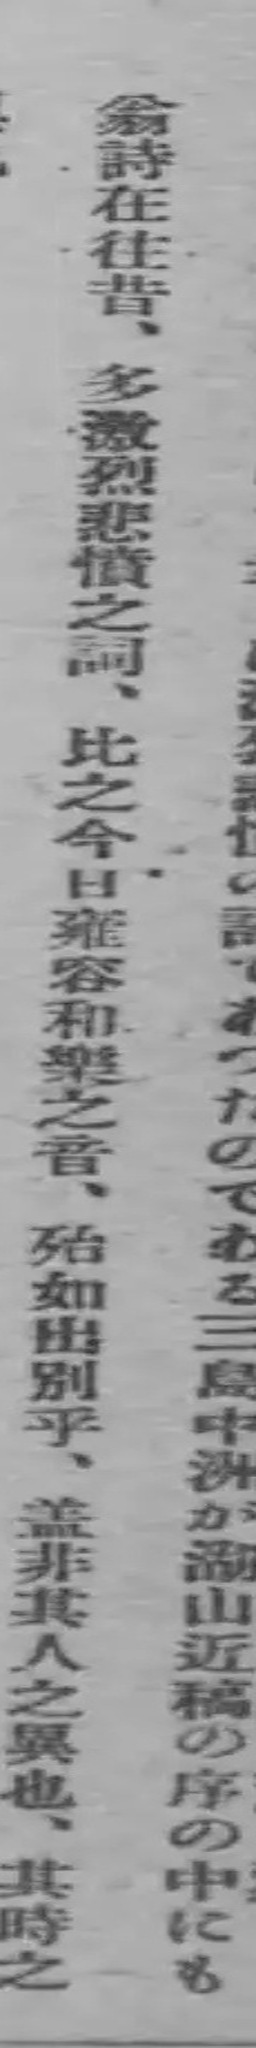翁詩在往昔、多激烈悲憤之詞、此之今日雍容和楽之者、殆如出別乎、盖非其人之異也、其時之
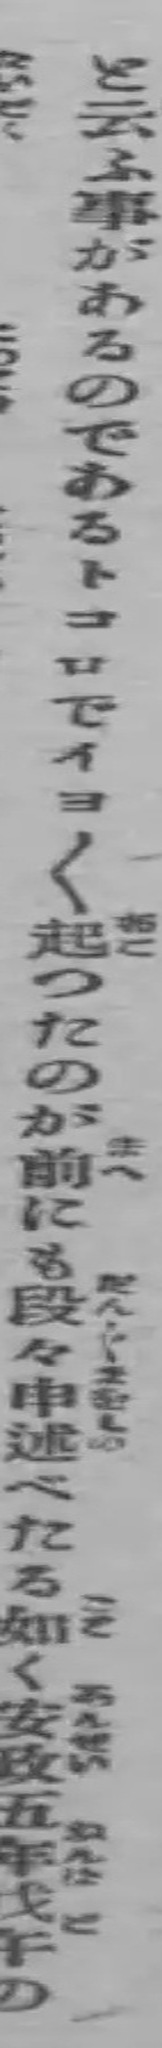と云ふ事があるのであるトコロでイヨ〳〵起つたのが前にも段々申述べたる如く安政五年戊午の
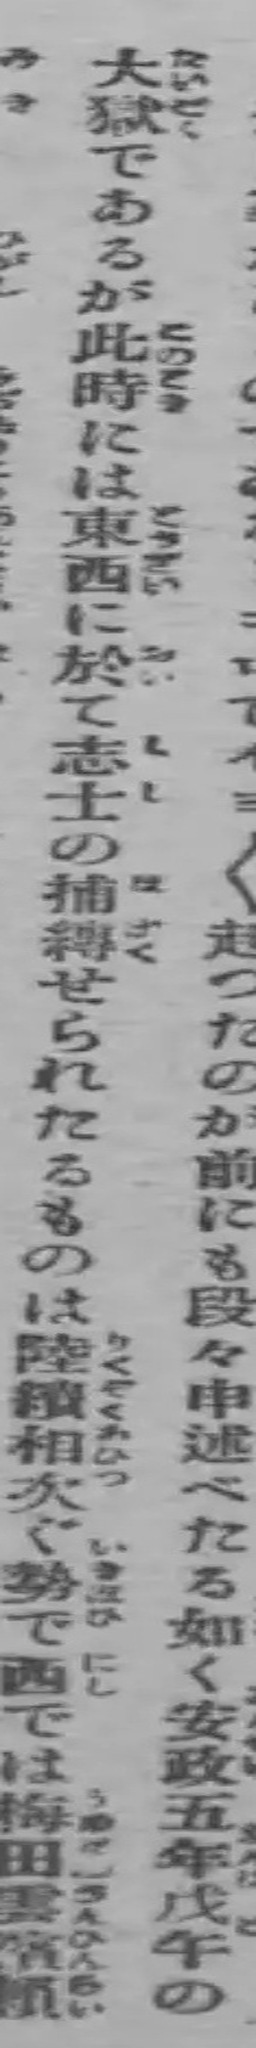大獄であるが此時には東西に於て志士の捕縛せられたるものは陸続相次ぐ勢で西では梅田雲浜頼
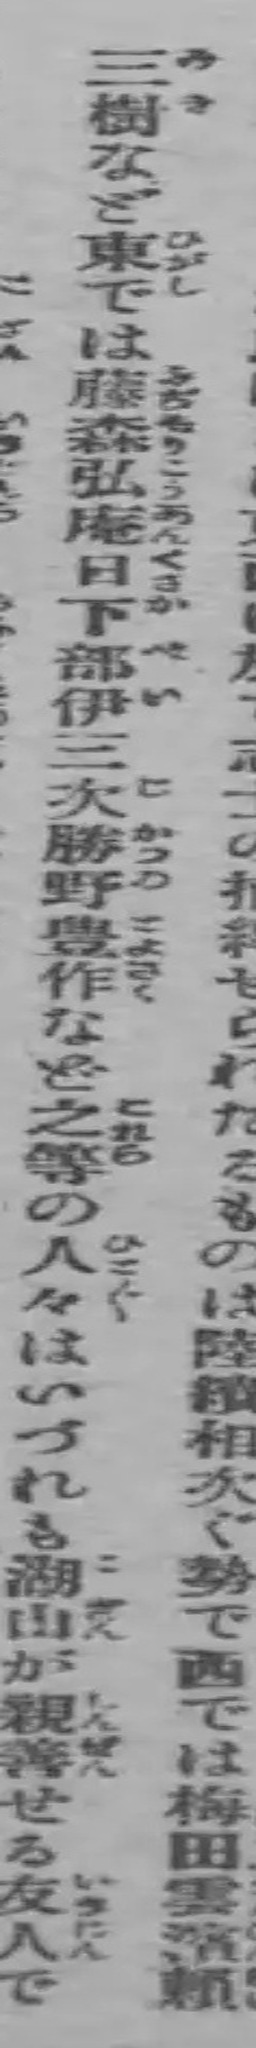樹三など東では藤森弘庵日下部伊三次勝野豊作など之等の人々はいづれも湖山が親善せる友人で
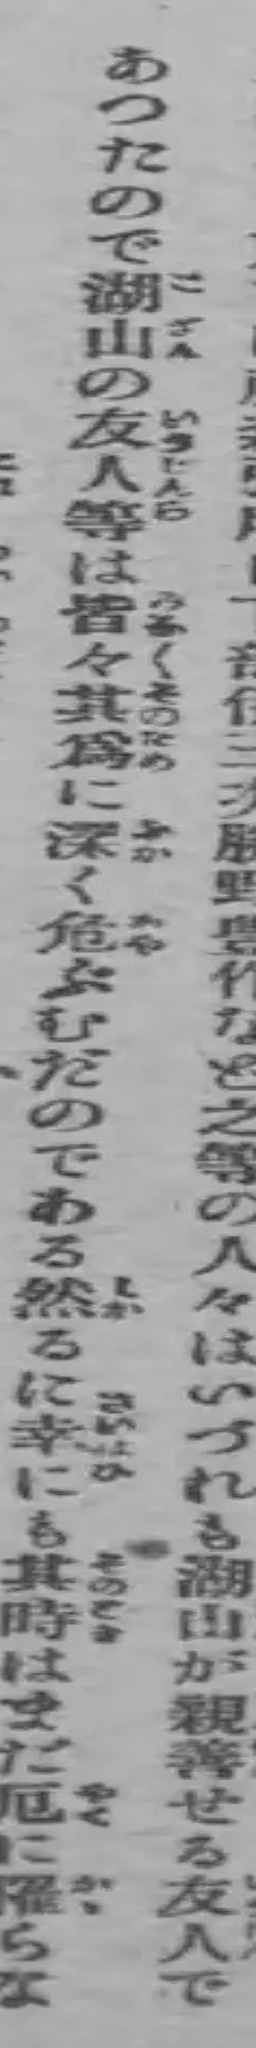あつたので湖山の友人等は皆々其為に深く危ぶむだのである然るに幸にも其時はまだ厄に罹らな
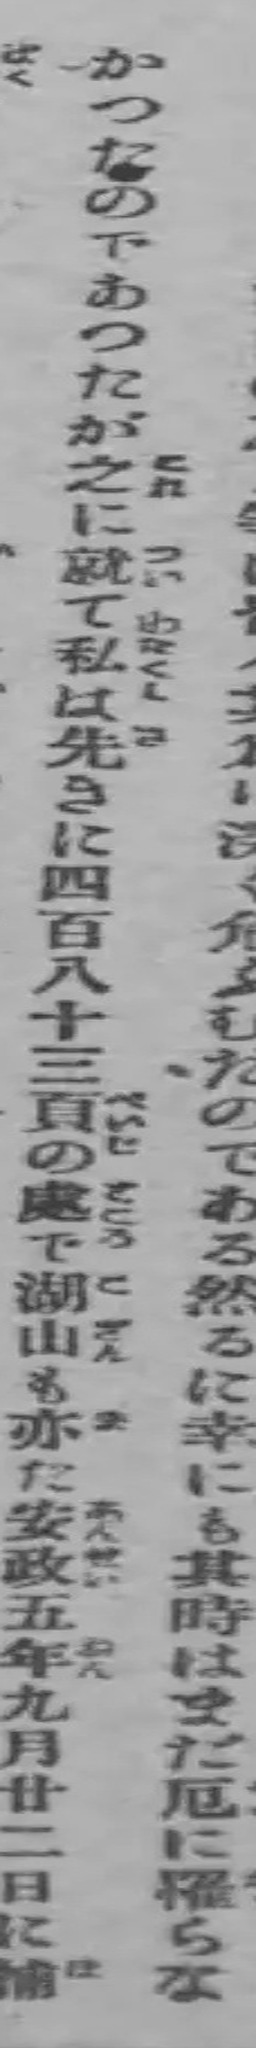かつたのであつたが之に就て私は先きに四百八十三頁の処で湖山も亦た安政五年九月廿二日に捕
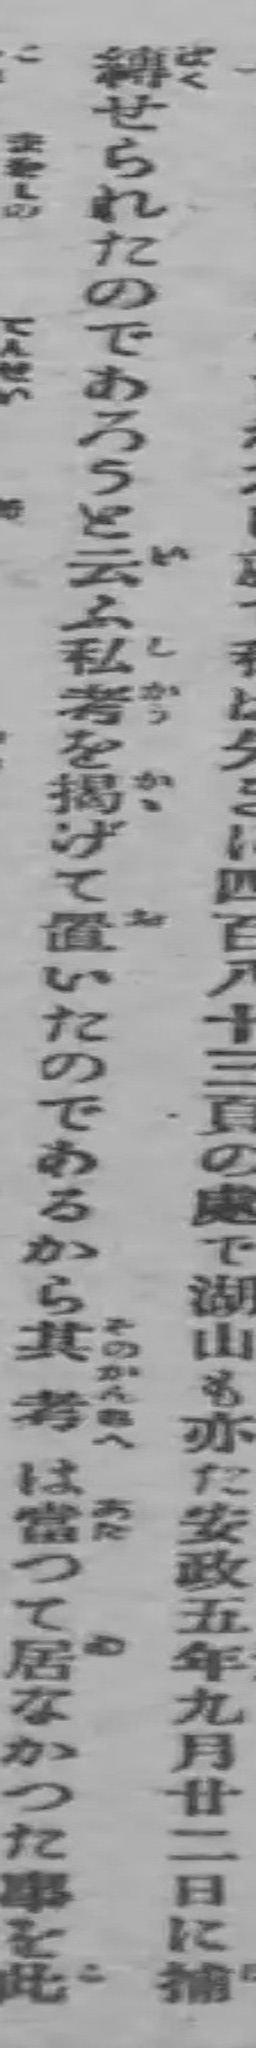縛せられたのであろうと云ふ私考を掲げて置いたのであるから其考は当つて居なかつた事を此
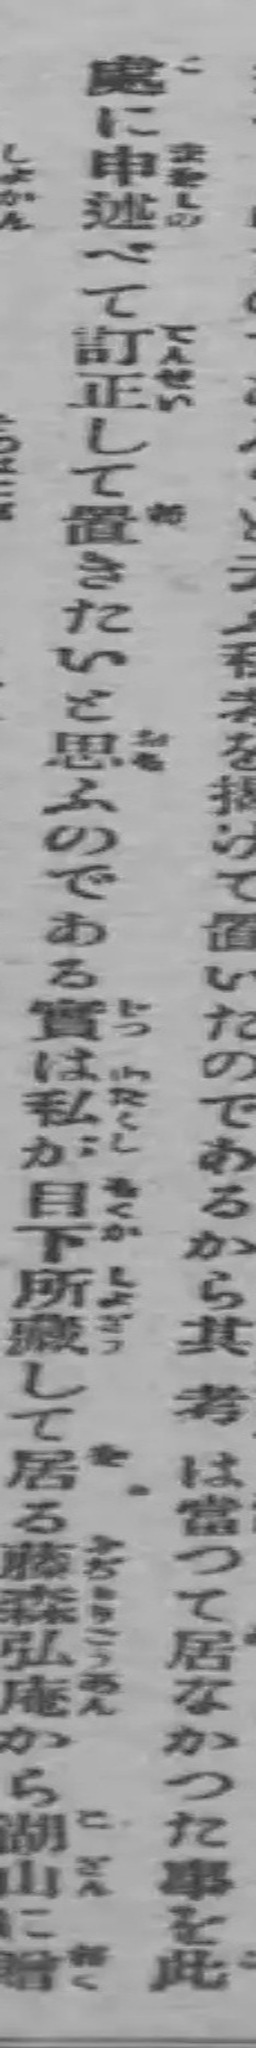処に申述べて訂正して置きたいと思ふのである実は私が目下所蔵して居る藤森弘庵から湖山に贈
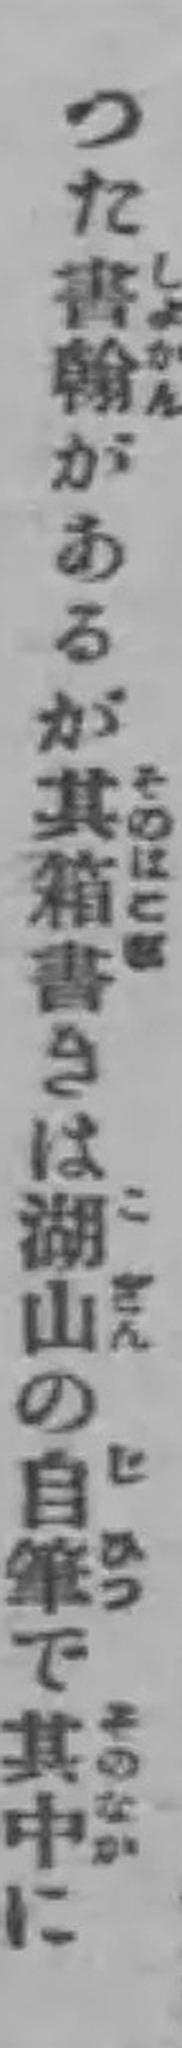つた書翰があるが其箱書きは湖山の自筆で其中に
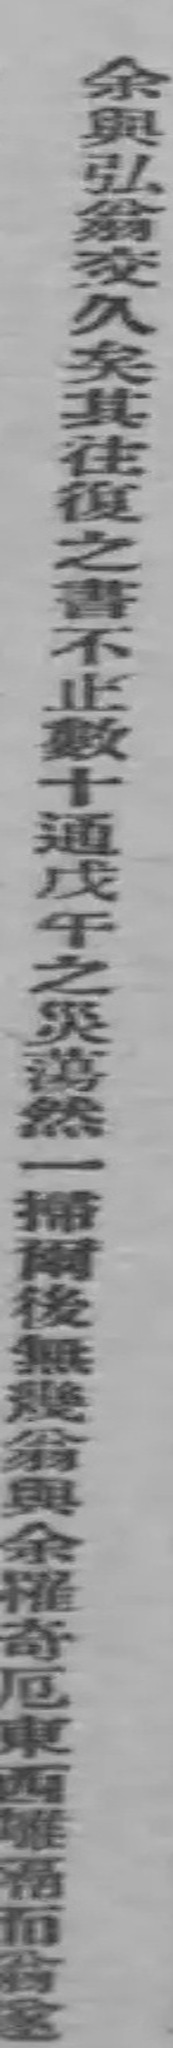余與弘翁交久矣其往復之書不止数十通戊午之災蕩然一掃爾後無幾翁與余罹奇厄東西離隔而翁遂
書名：豊橋市史談
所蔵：国立国会図書館 National Diet Library, JAPAN
